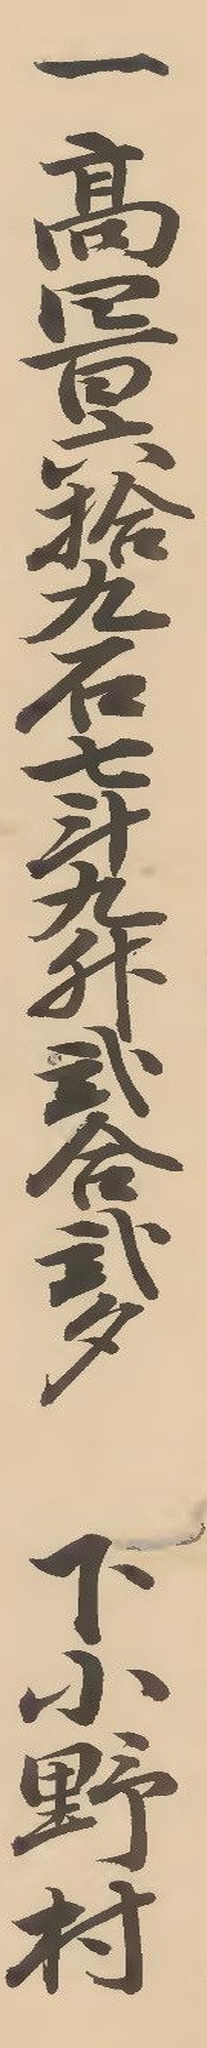一高四百六拾九石七斗九升弐合弐勺下小野村
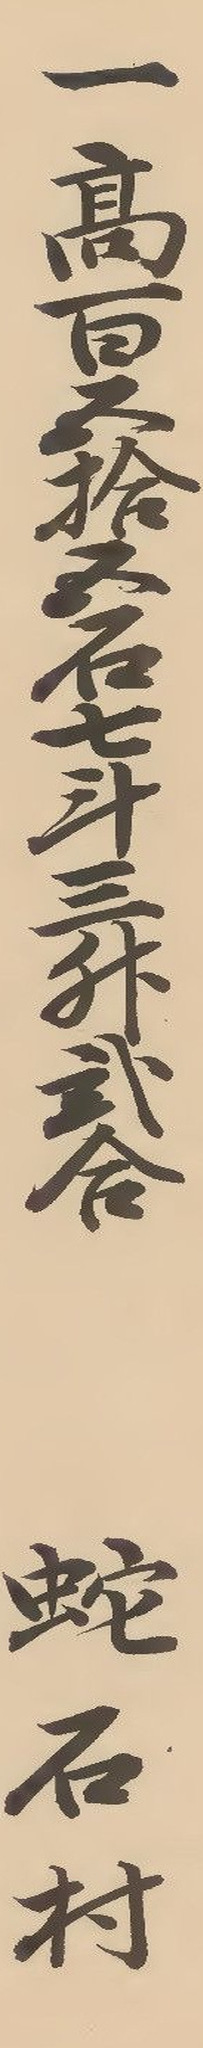一高百五拾五石七斗三升弐合蛇石村
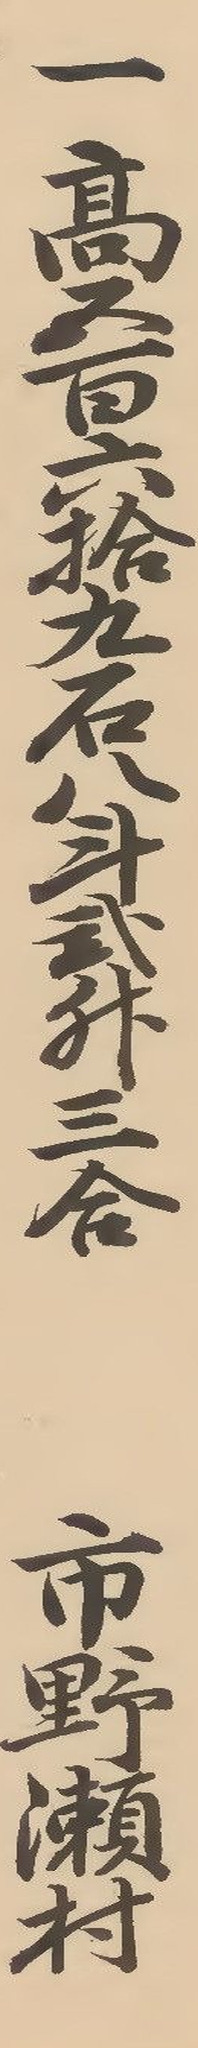一高五百六拾九石八斗弐升三合市野瀬村
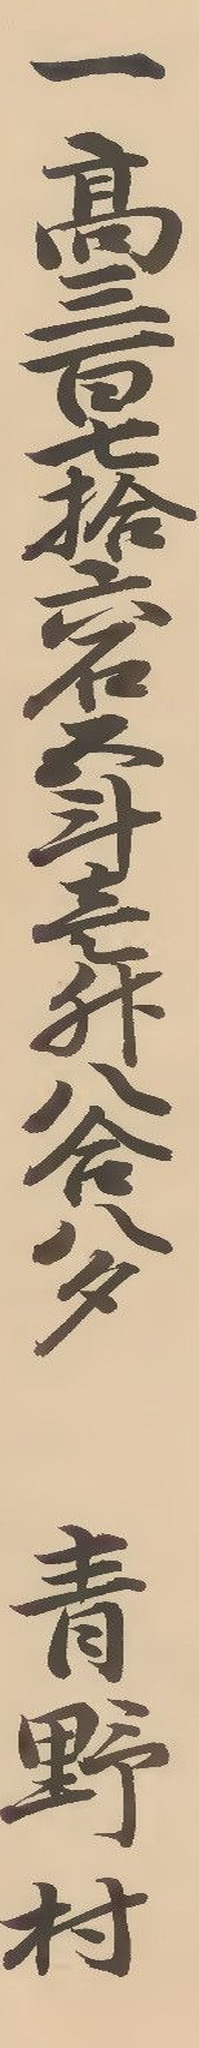一高三百七拾六石五斗壱升八合八勺青野村
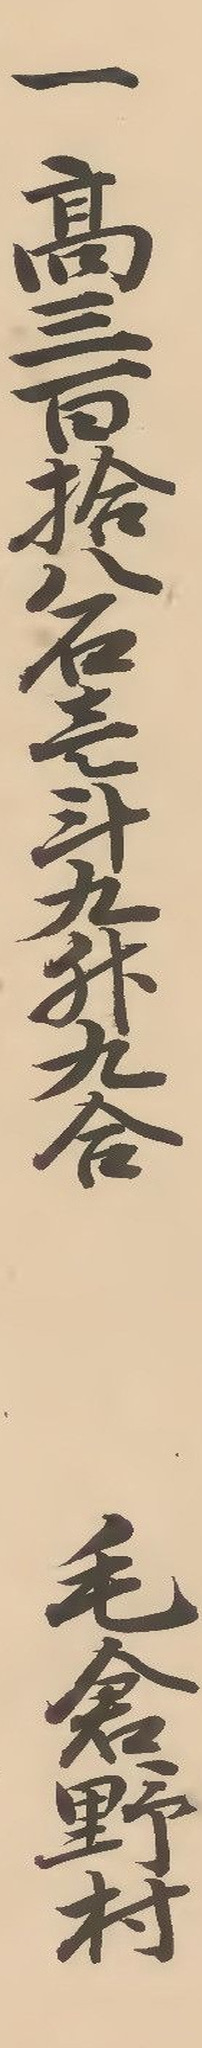一高三百拾八石壱斗九升九合毛倉野村
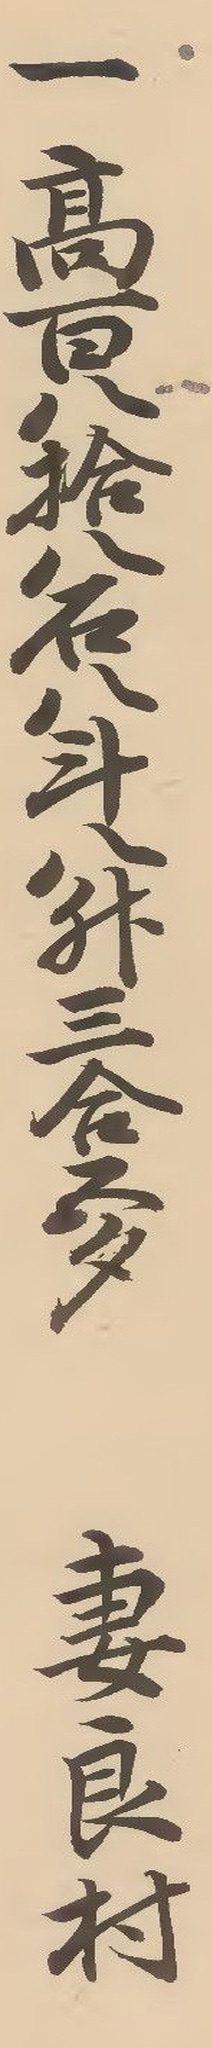一高百八拾八石八斗八升三合五勺妻良村
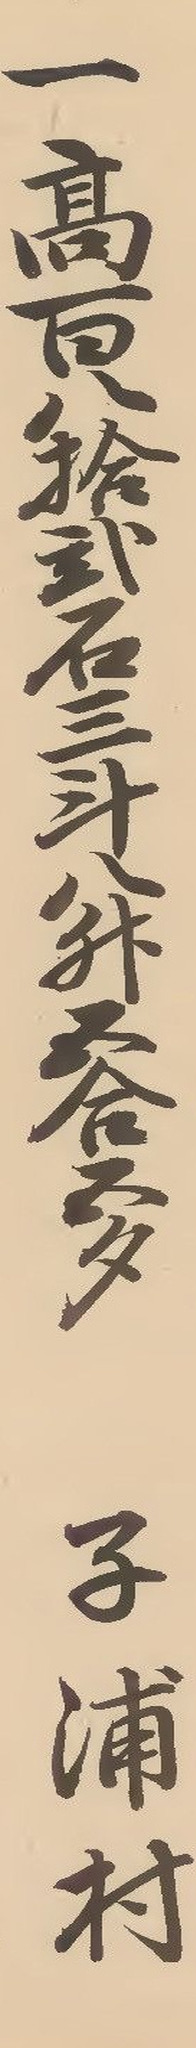一高百八拾弐石三斗八升五合五勺子浦村

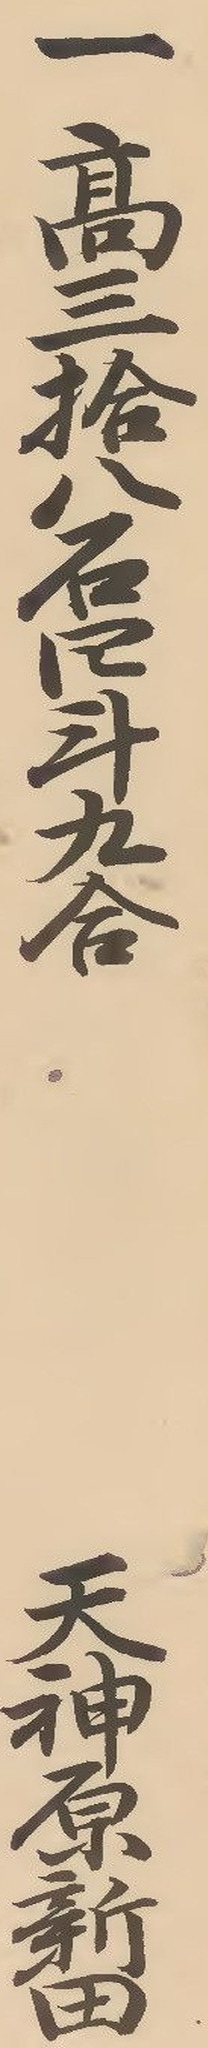一高三拾八石四斗九合天神原新田
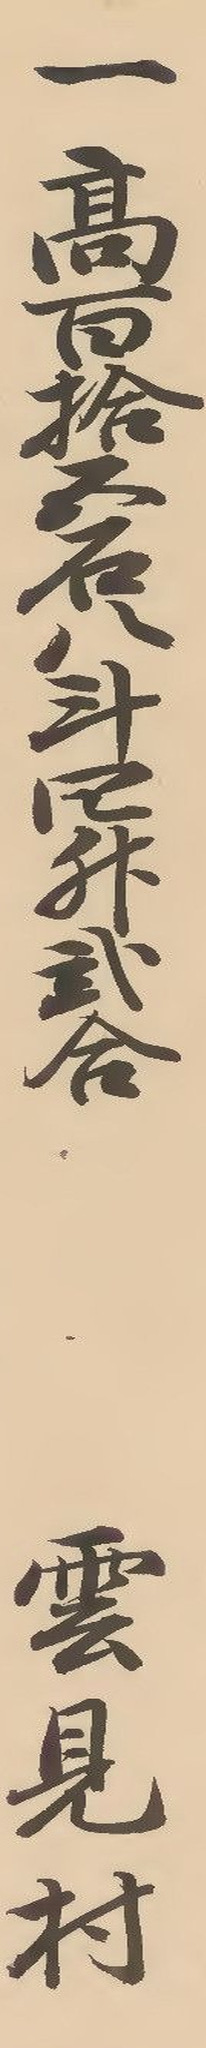一高百拾五石八斗四升弐合雲見村
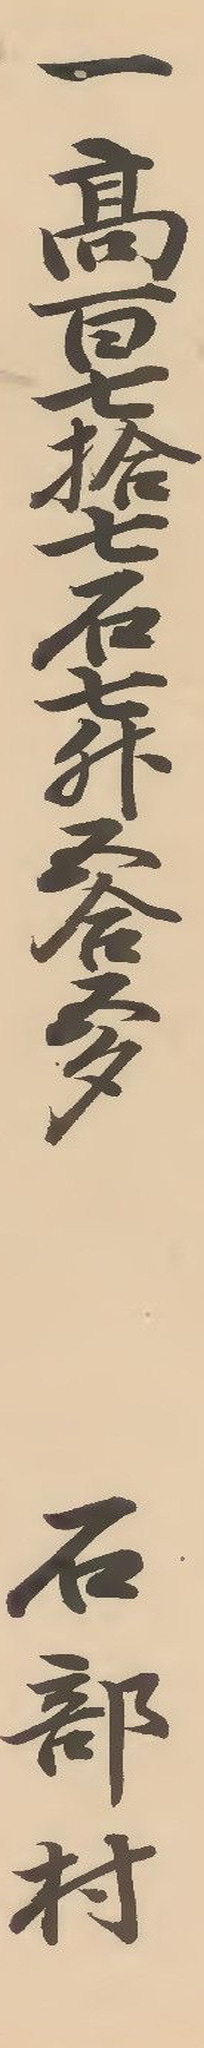一高百七拾七石七升五合五勺石部村
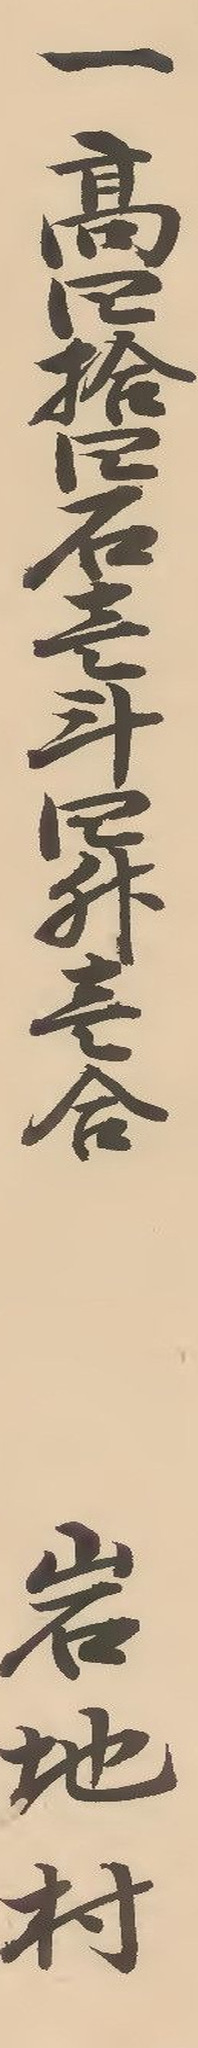一高四拾四石壱斗四升壱合岩地村
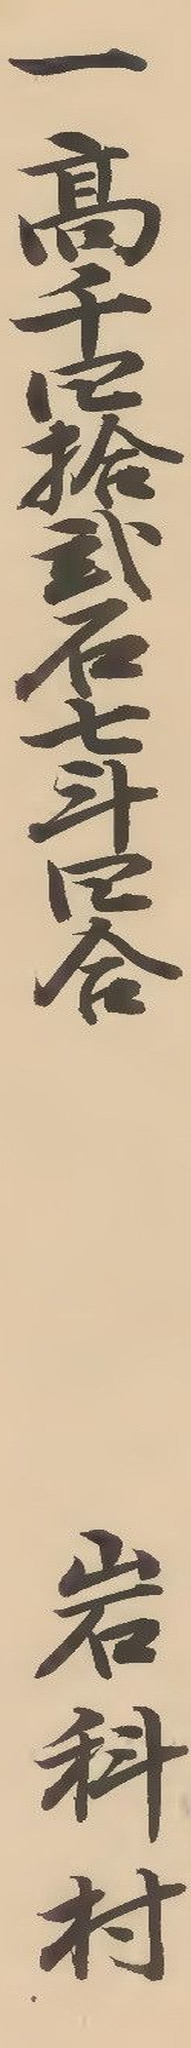一高千四拾弐石七斗四合岩科村
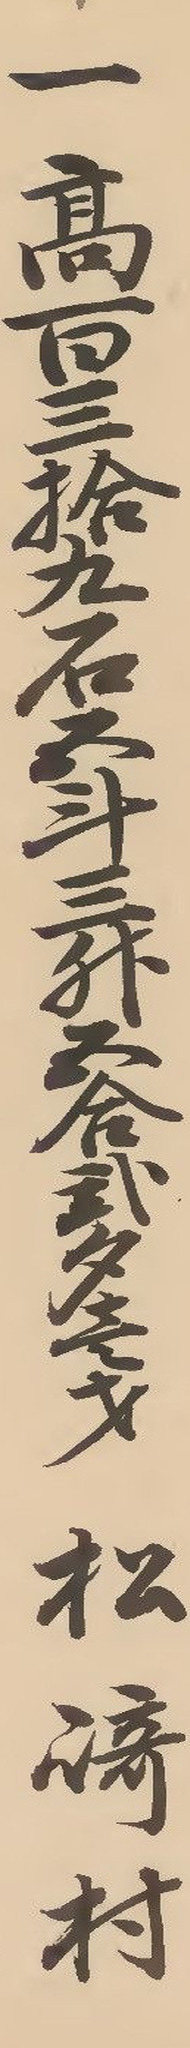一高百三拾九石五斗三升五合弐勺壱才松崎村
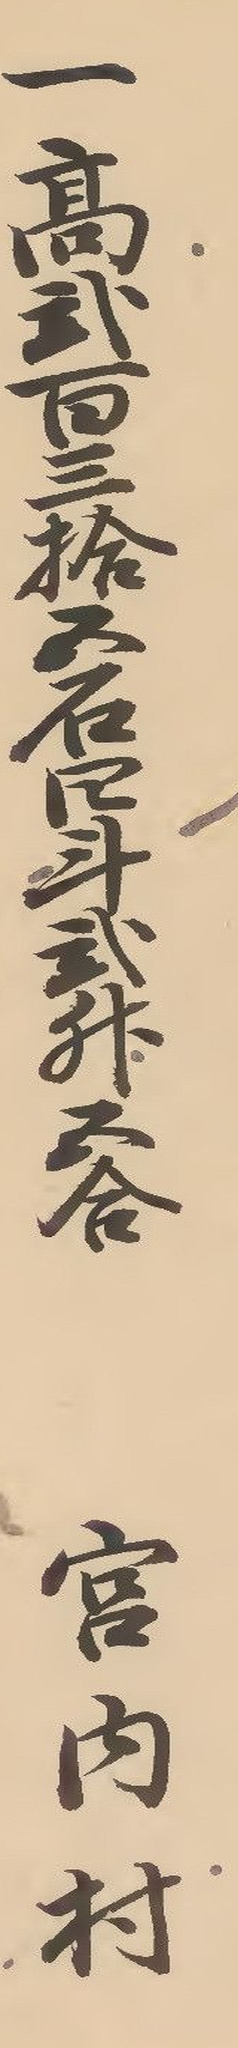一高弐百三拾五石四斗弐升五合宮内村

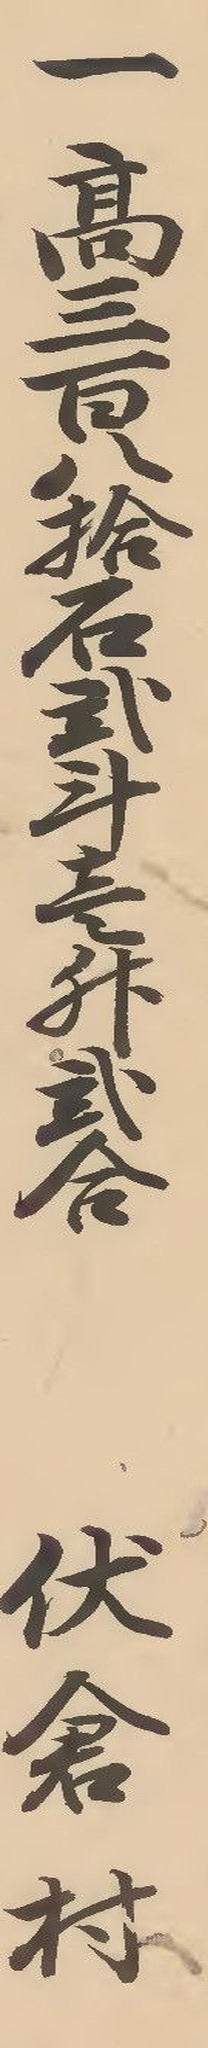一高三百八拾石弐斗壱升弐合伏倉村
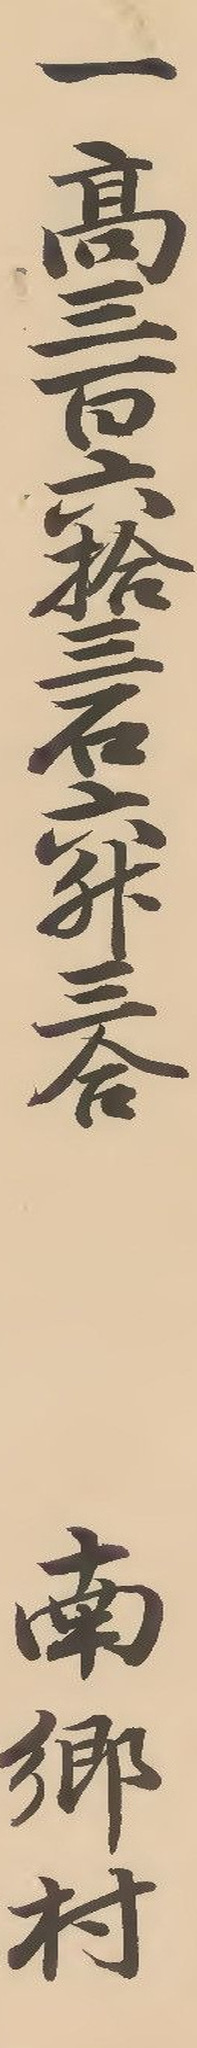一高三百六拾三石六升三合南郷村
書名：伊豆国郷帳
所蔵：国立公文書館 National Archives of Japan
